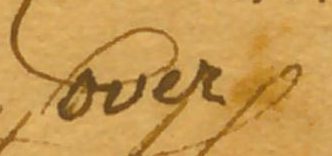over
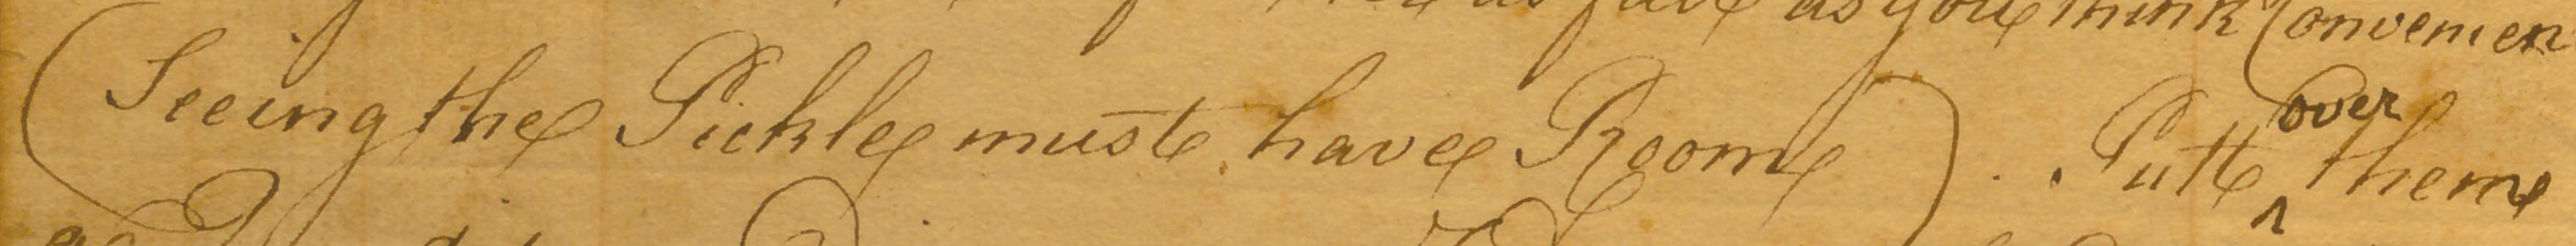(Seeing the Pickle must have Room) Putt ^ them
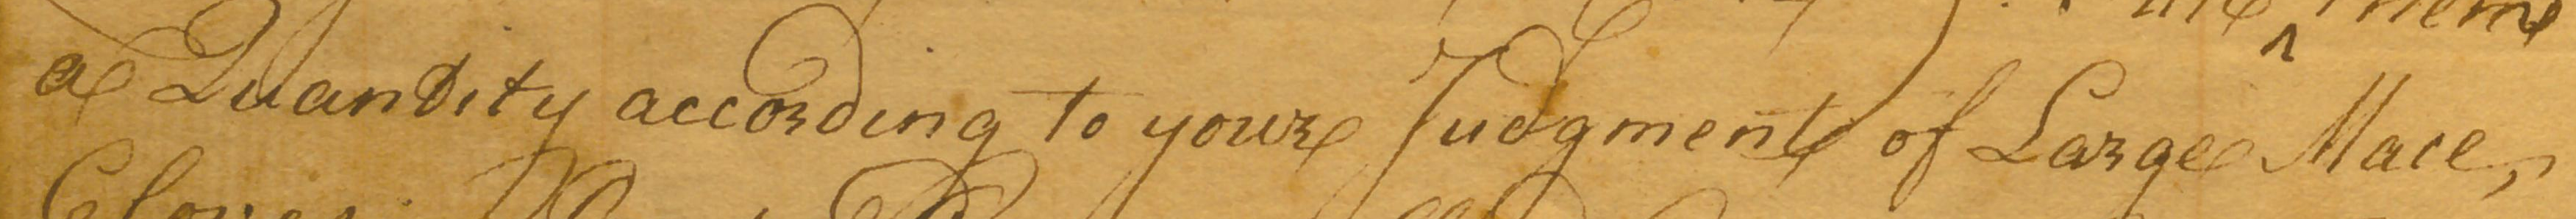a Quantity according to your Judgment of Large Mace,
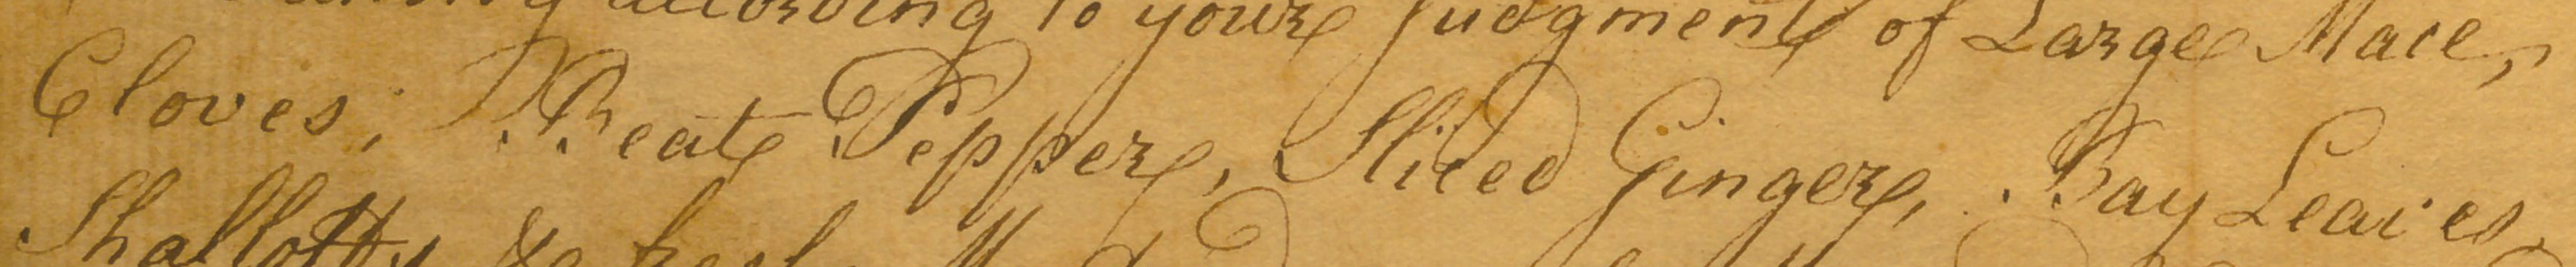Cloves, Beat Pepper, Sliced Ginger, Bay Leaves
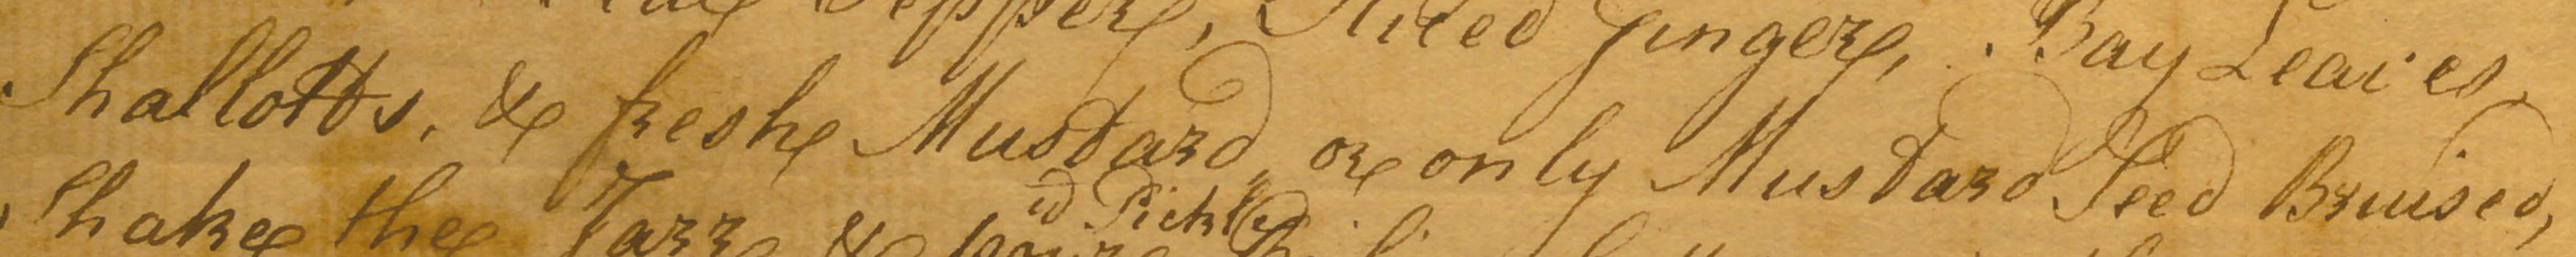Shallotts & fresh Mustard or only Mustard Seed Bruised
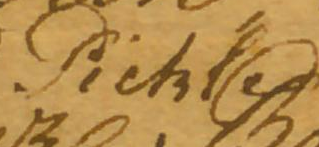Pickles
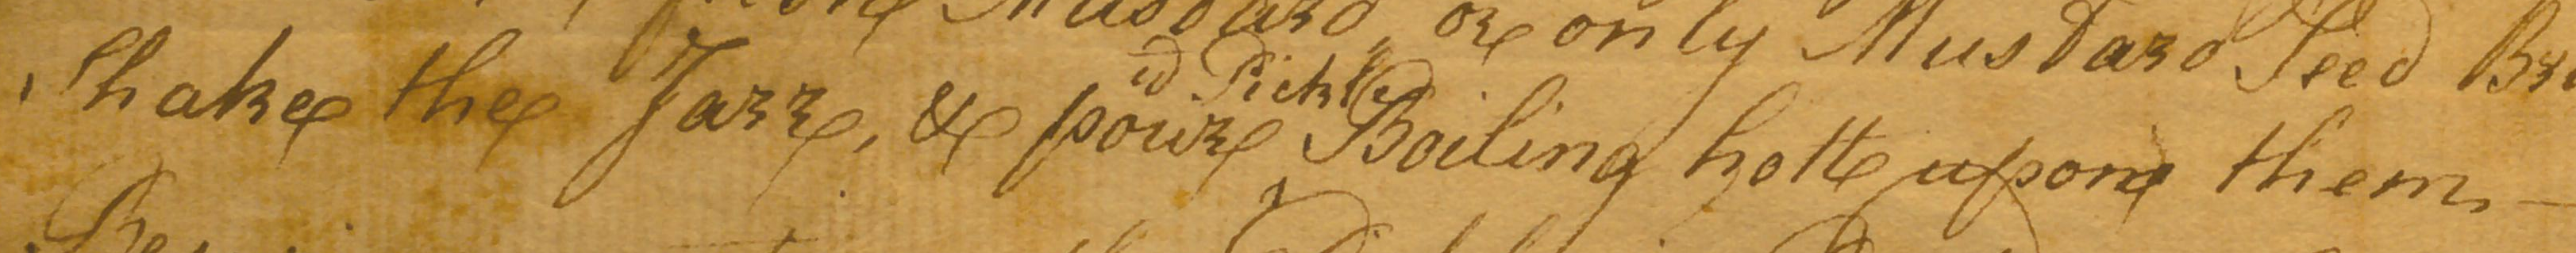Shake the Jarr, & pour ^ Boiling hott upon them,-
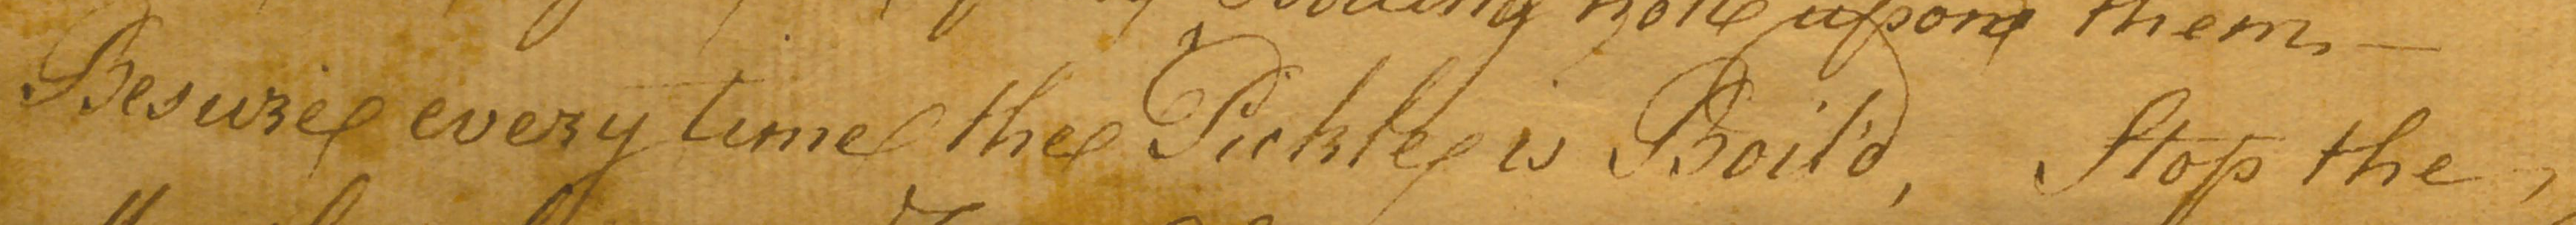Be sure every time the Pickle is Boil'd, stop the
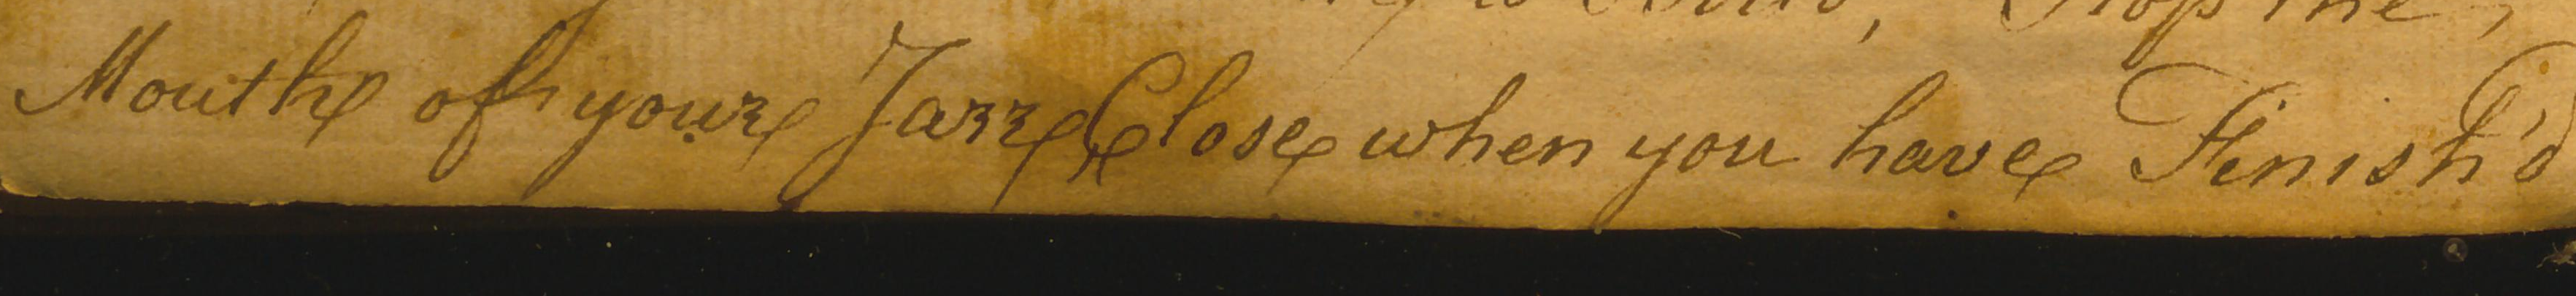Mouth of your Jarr, Close when you have Finish'd
